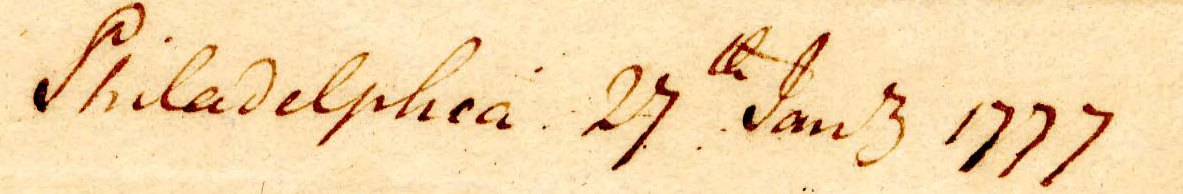Philadelphia 27^th Jan^y 1777
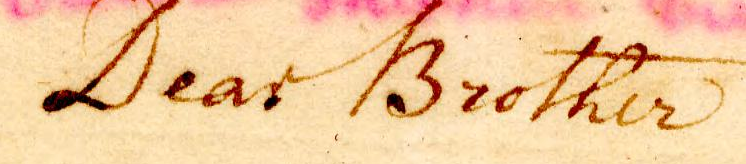Dear Brother
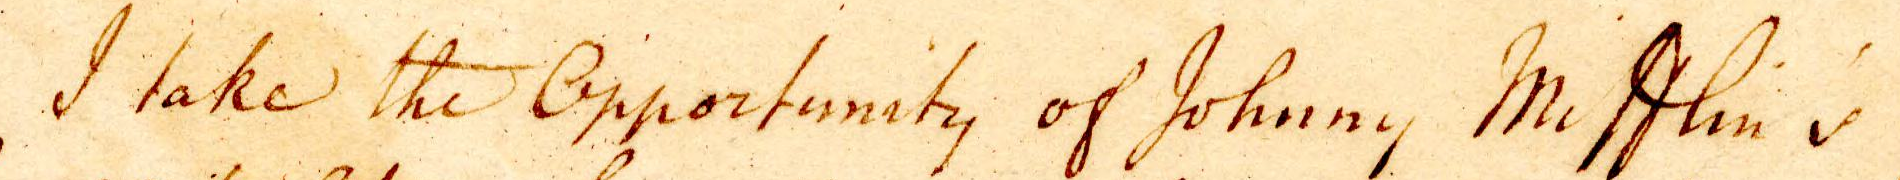I take the Opportunity of Johnny Mifflin's
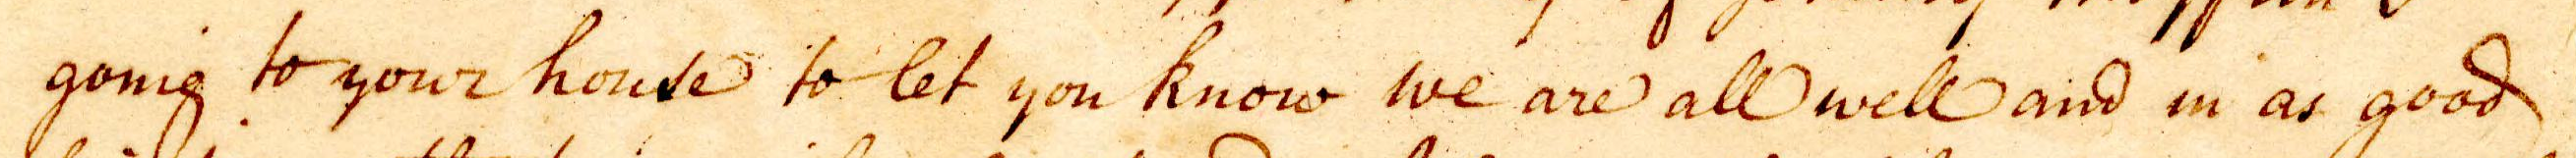going to your house to let you know we are all well and in as good
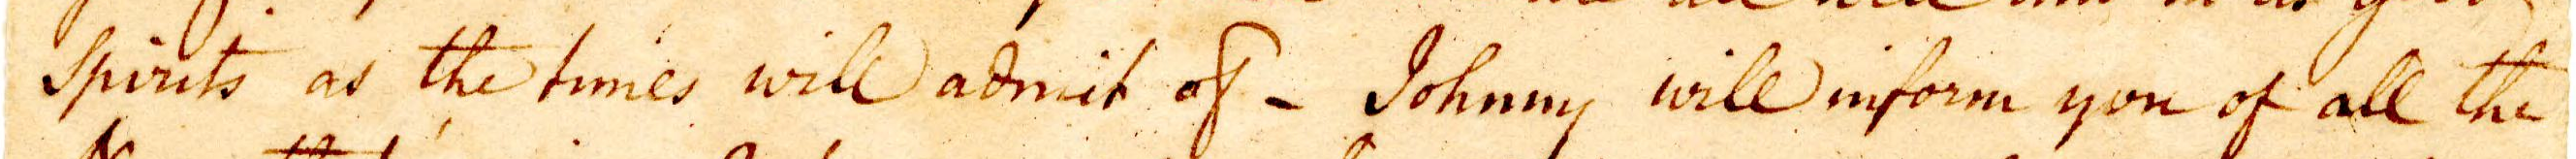spirits as the times will admit of- Johnny will inform you of all the
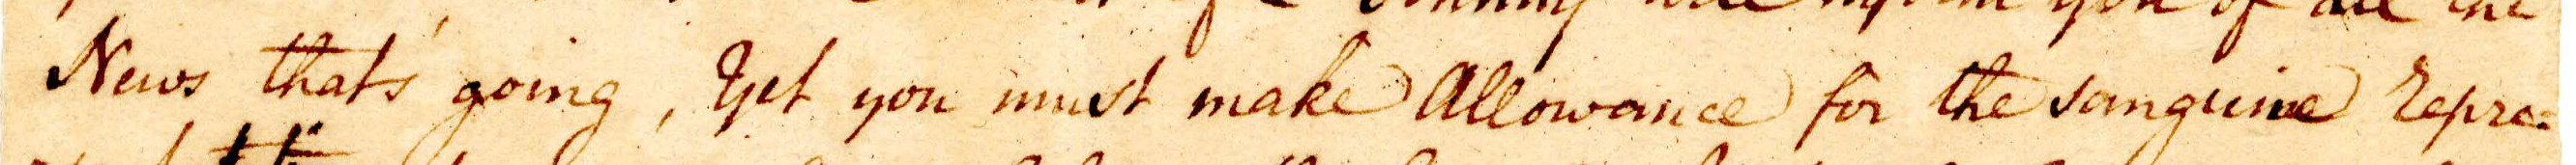News that's going, Yet you must make Allowance for the sanguine repre-
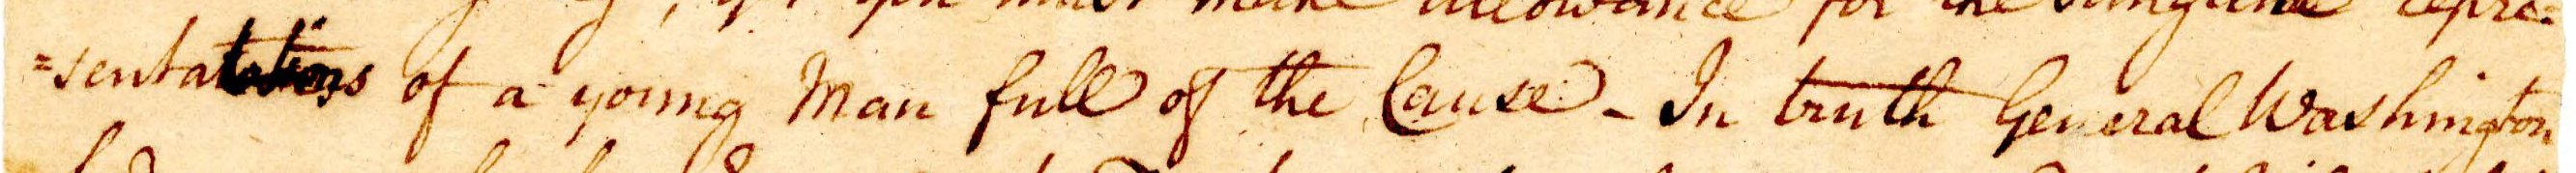-sentations of a young Man full of the Course- In truth General Washington
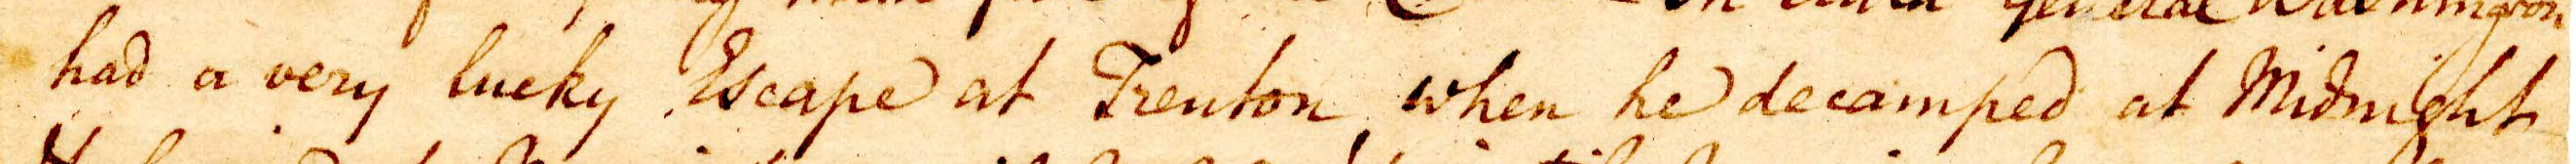had a very lucky Escape at Trenton, when he decamped at Midnight
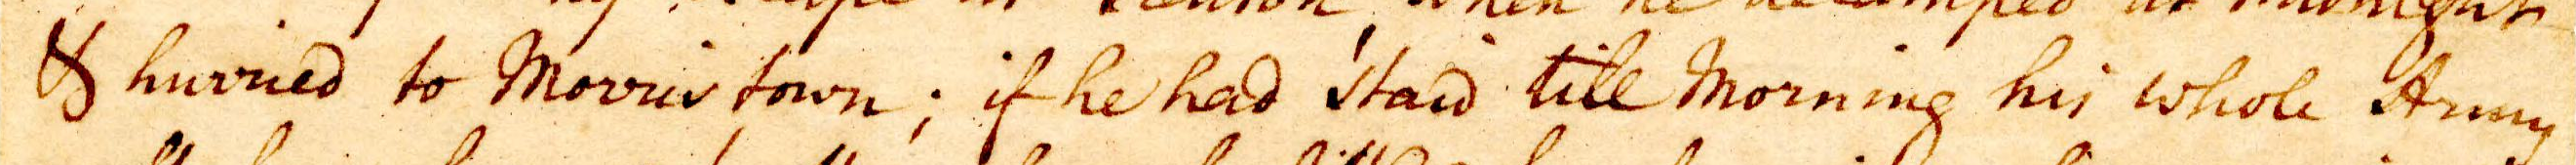& hurried to Morristown; if he had staid till Morning his whole Army
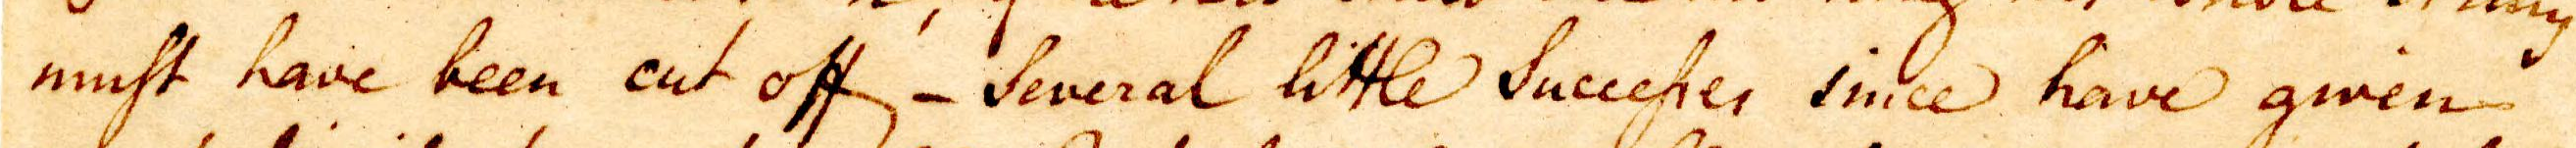must have been cut off- Several little Successes since have given
